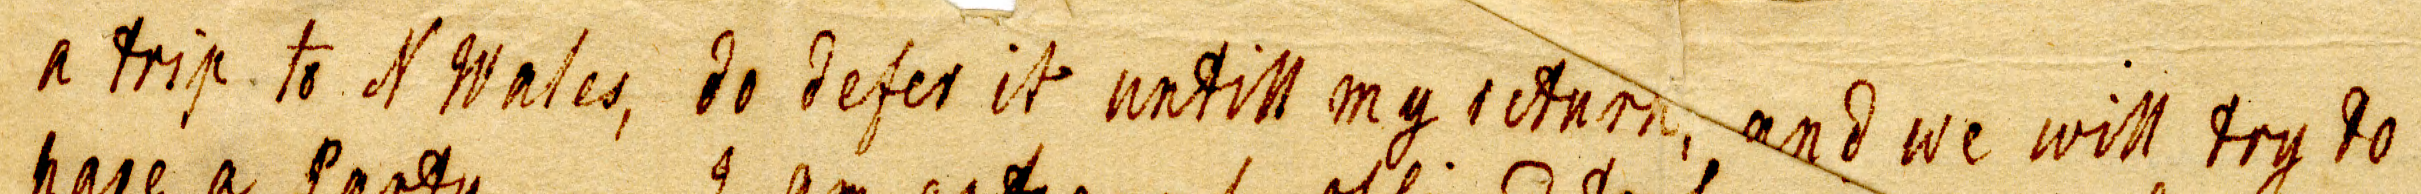a trip to N Wales, do defer it until my return, and we will try to
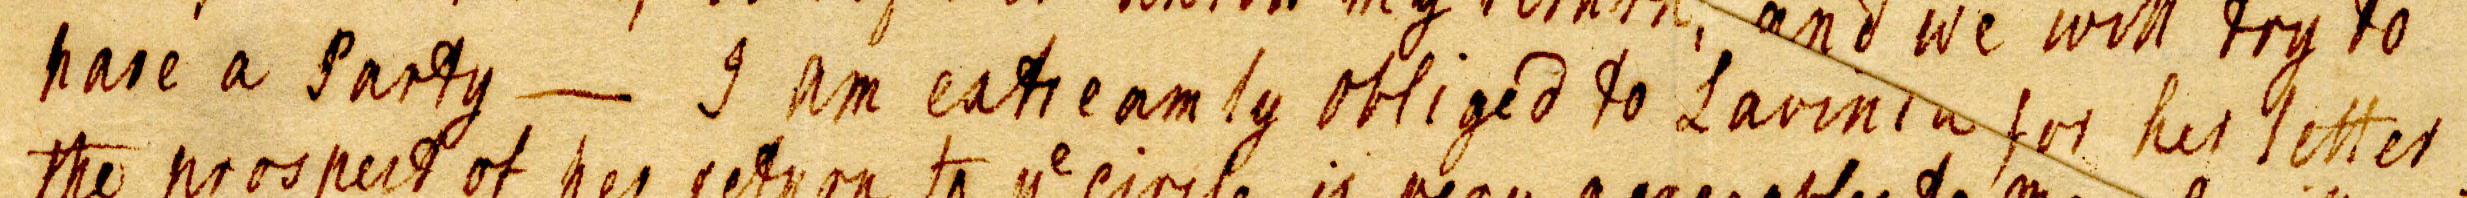have a Party- I am extreamly obliged to Lavinia for her letter
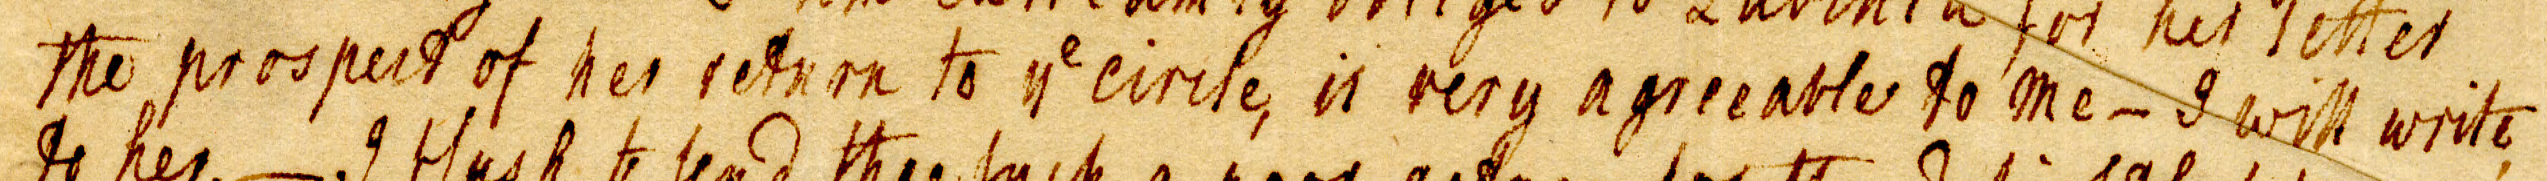the prospect of her return to y^e circle, is very agreeable to me- I will write
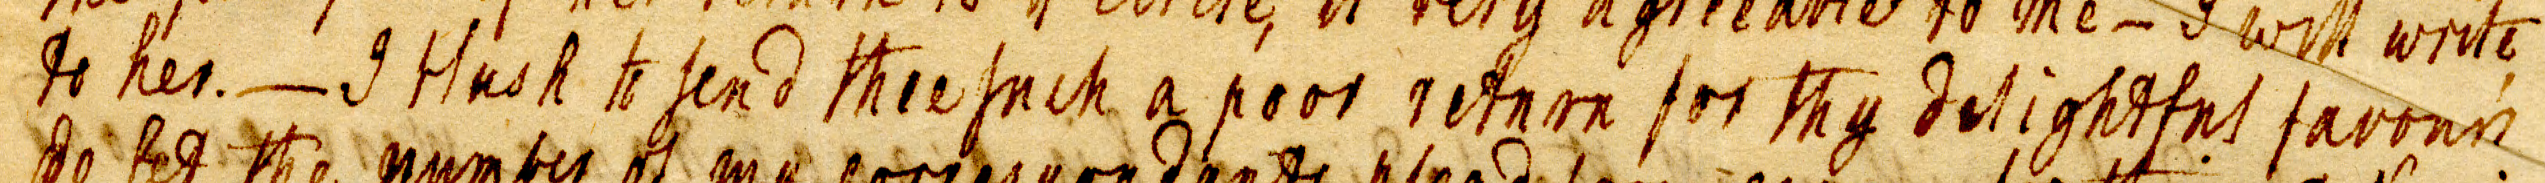to her.- I blush to send thee such a poor return for thy delightful favour's
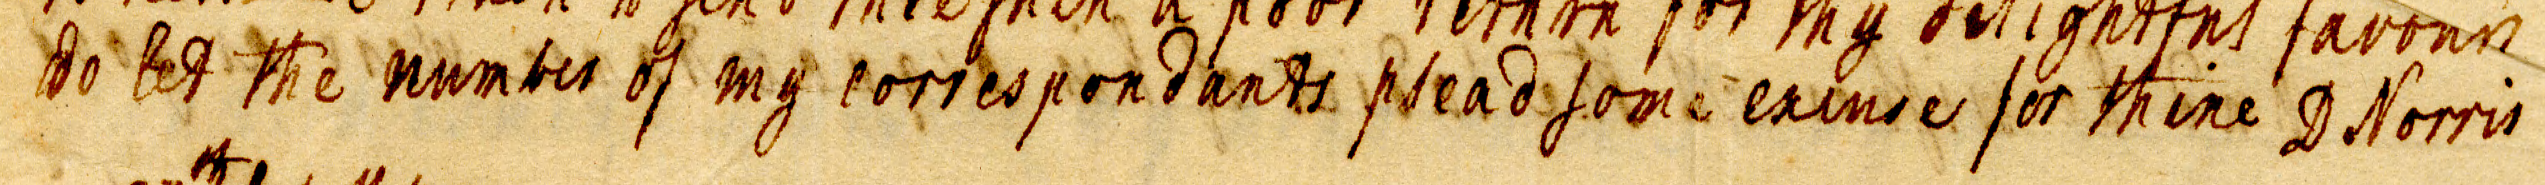do bet the number of my correspondence plead some excuse for thine D Norris
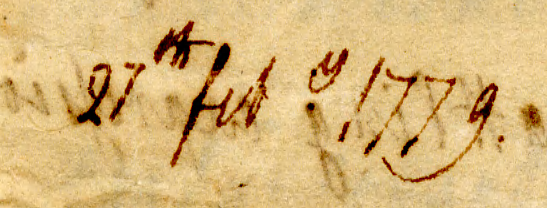27^th feb^y. 1779.
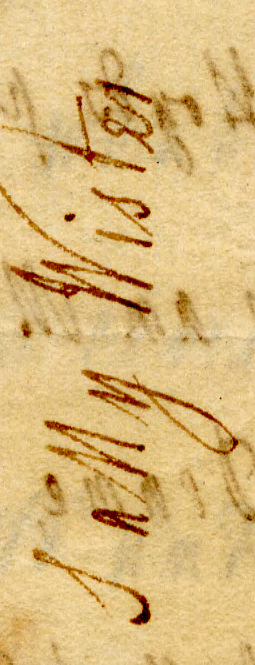Sally Wister
